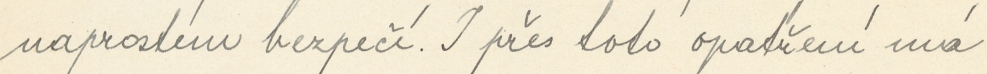naprostém bezpečí. I přes toto opatření má
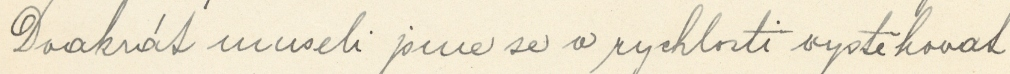Dvakrát museli jsme se v rychlosti vystěhovat
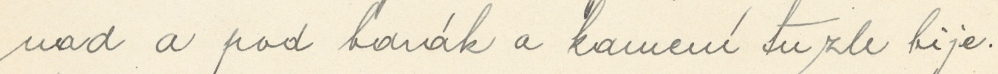nad a pod barák a kamení tu zle bije.
